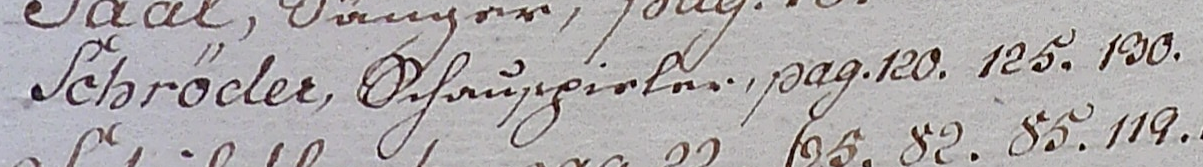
Schröder, Schauspieler, pag. 120. 125. 130.
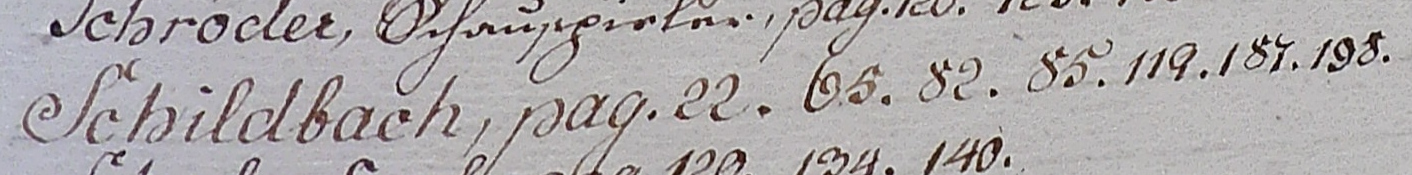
Schildbach, pag. 22.65. 82. 119. 187. 198.
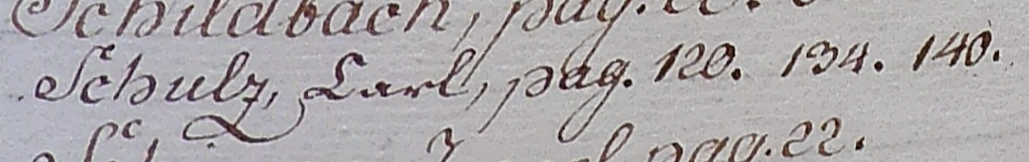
Schulz, Carl, pag. 120. 134. 140.
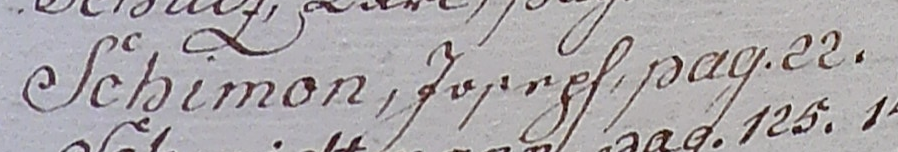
Schimon, Joseph, pag. 22.
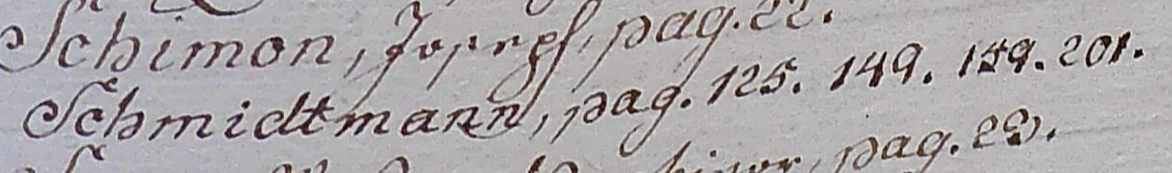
Schmidtmann, pag. 125. 149. 159. 201.
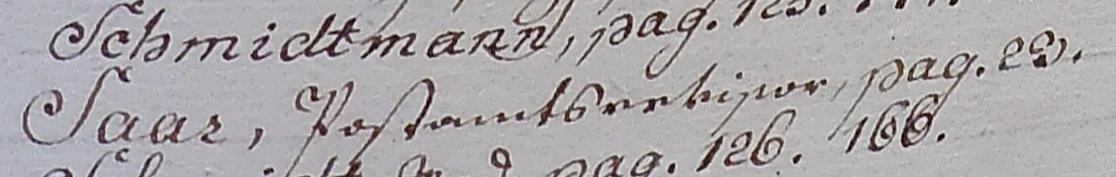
Saar, Postamtsrevisor, pag. 23.
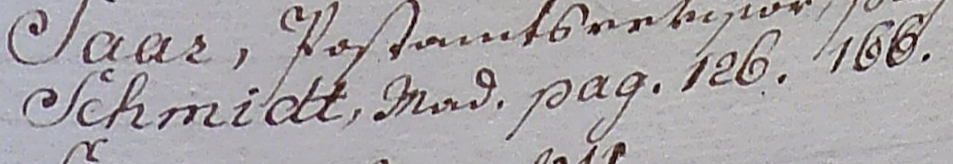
Schmidt, Mad. pag. 126. 166.
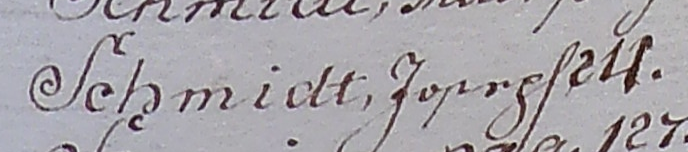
Schmidt, Joseph, 24.
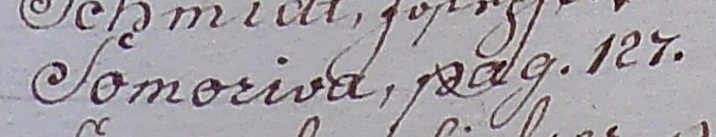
Somoriva, pag. 127
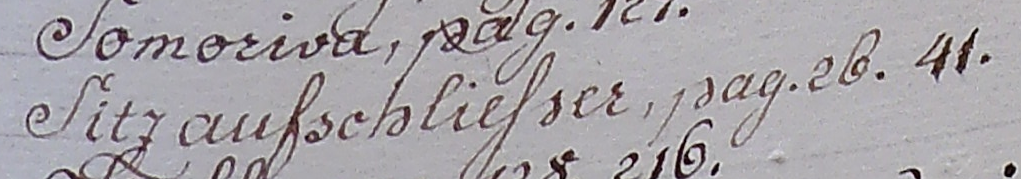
Sitzaufschliesser, pag. 26. 41.
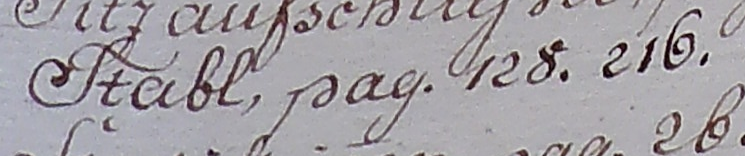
Stabl, pag. 128. 216.
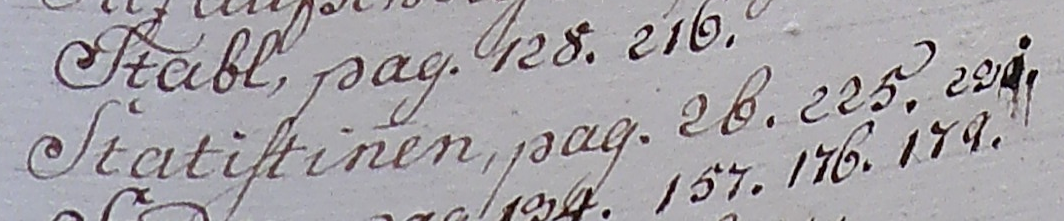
Statistin̅en, pag. 26. 225. 231.
